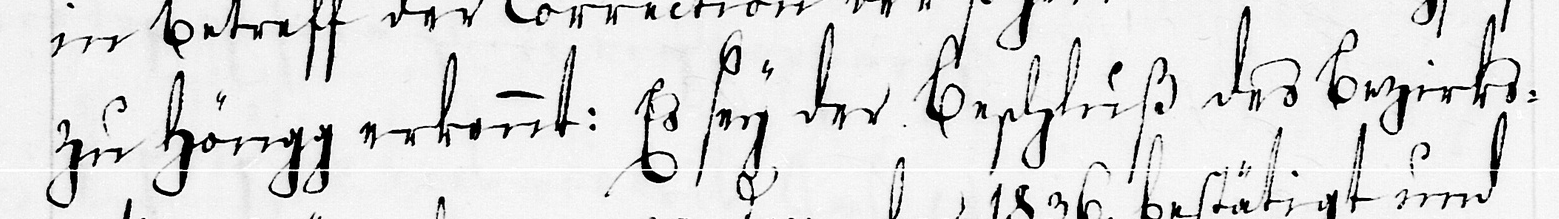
zu Höngg erkennt: Es sey der Beschluß des Bezirks¬
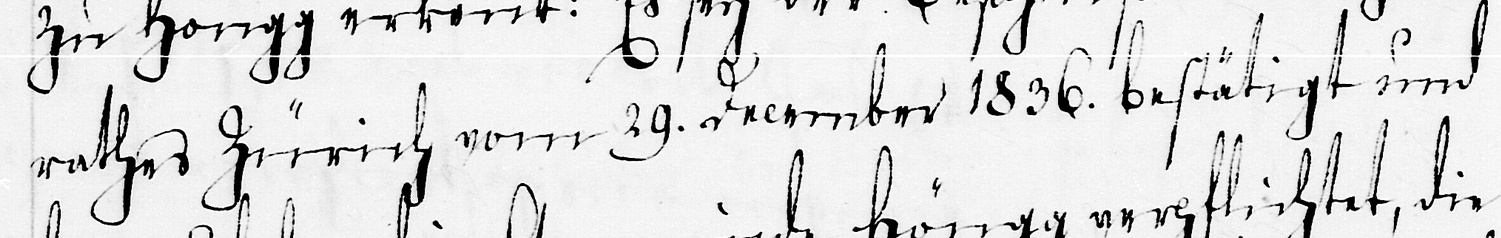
rathes Zürich vom 29. December 1836. bestätigt und
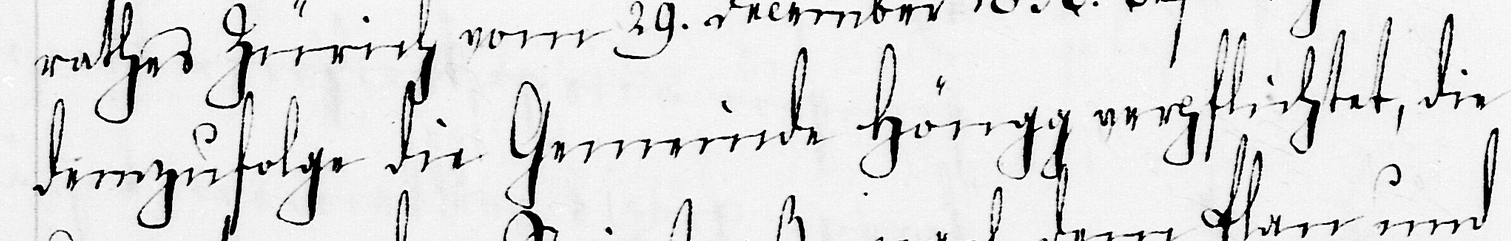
demzufolge die Gemeinde Höngg verpflichtet, die
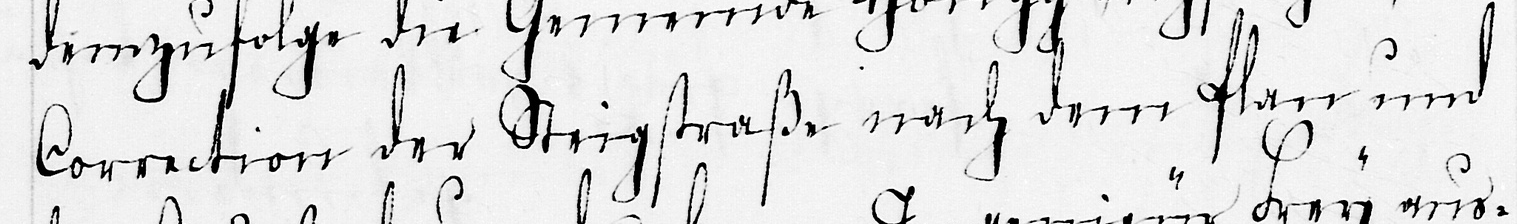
Correction der Steigstraße nach dem Plan und
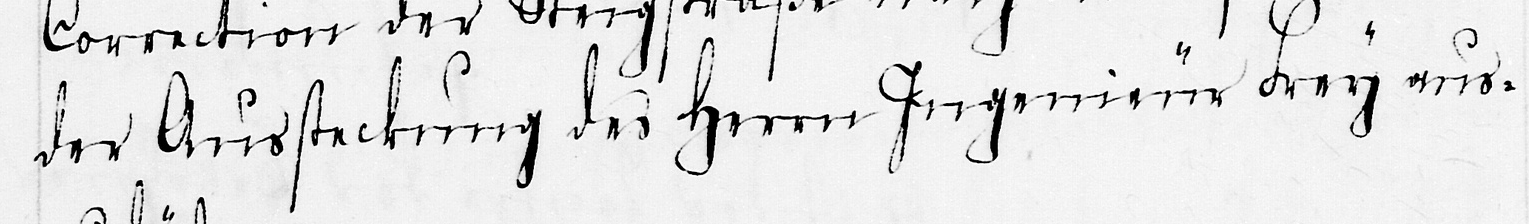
der Aussteckung des Herrn Ingenieur Frey aus¬
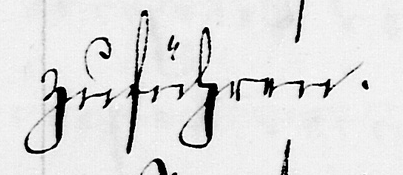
zuführen.
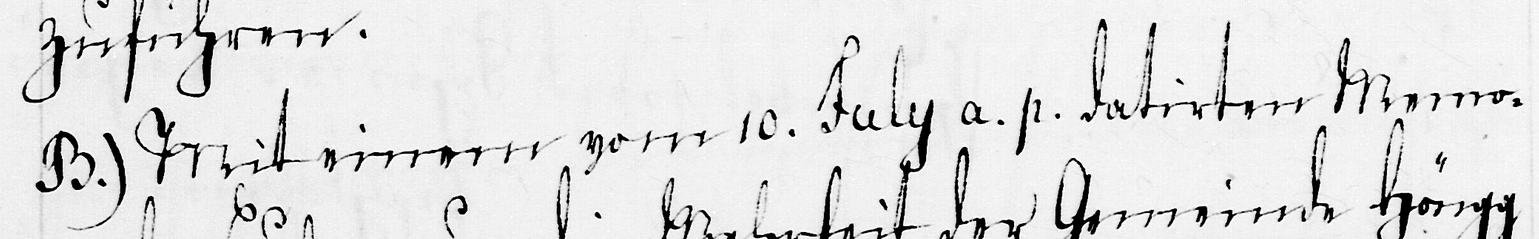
B.) Mit einem vom 10. July a. p. datirten Memo¬
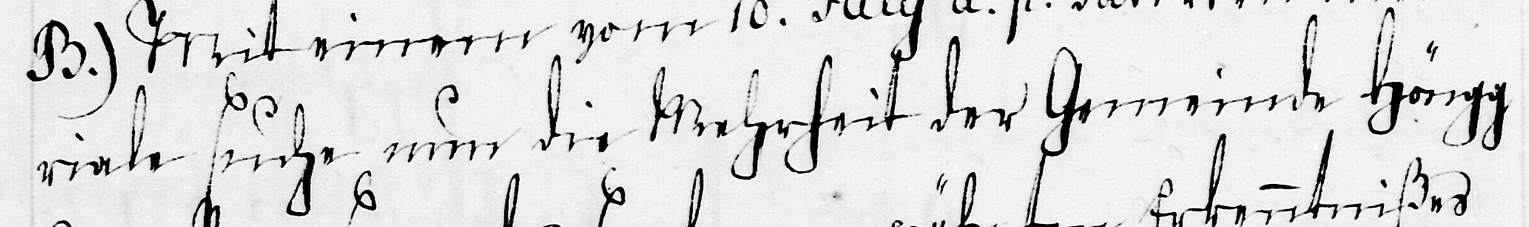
riale suche nun die Mehrheit der Gemeinde Höngg
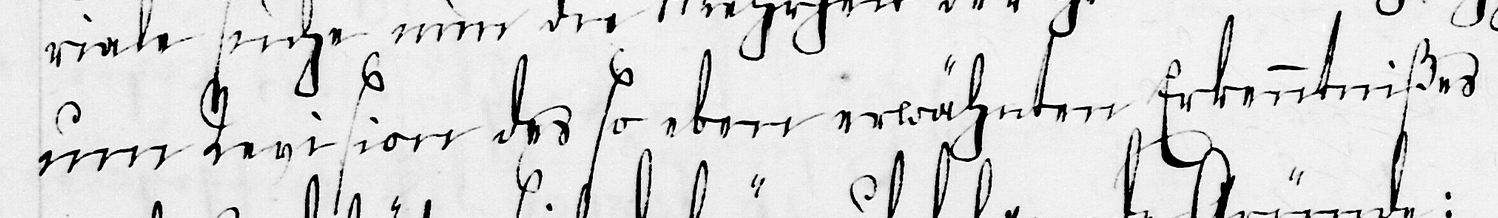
um Revision des so eben erwähnten Erkenntnißes
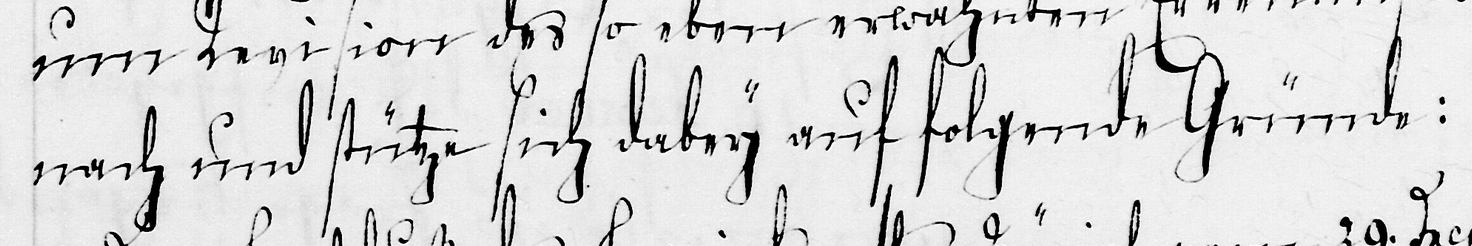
nach und stütze sich dabey auf folgende Gründe:
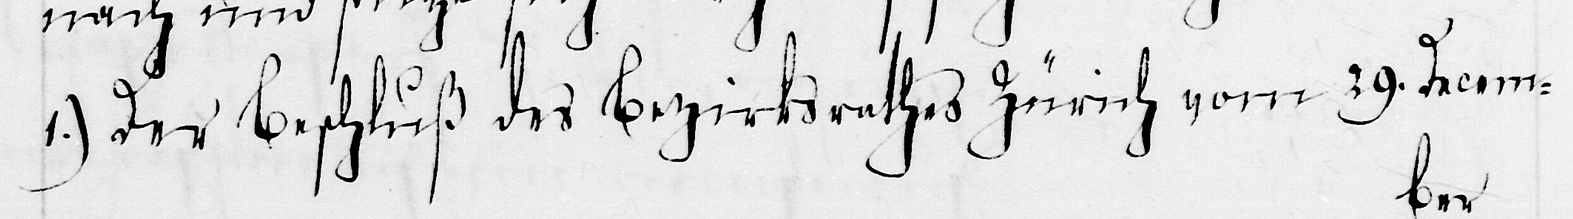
1.) Der Beschluß des Bezirksrathes Zürich vom 29. Decem-
